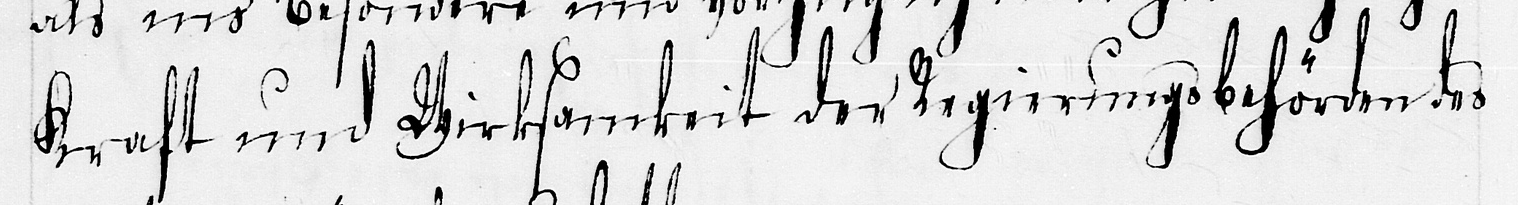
Kraft und Wirksamkeit der Regierungsbehörden des
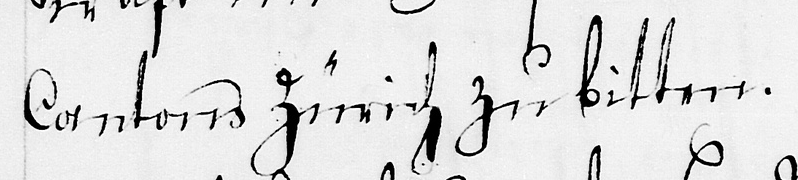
Cantons Zürich zu bitten.
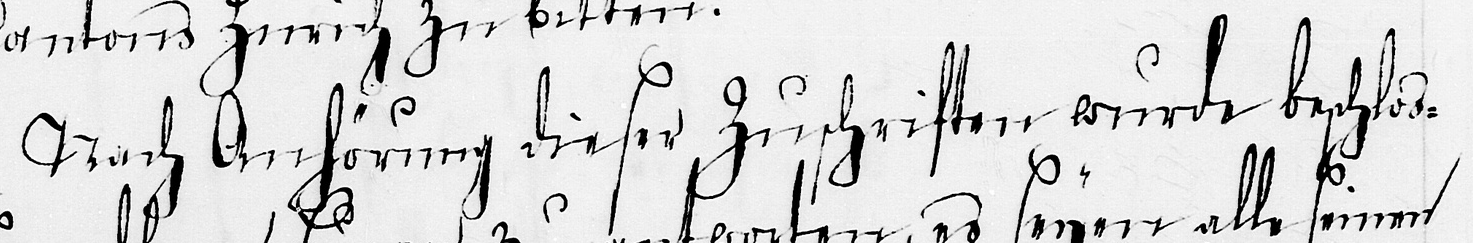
Nach Anhörung dieser Zuschriften wurde beschlo¬
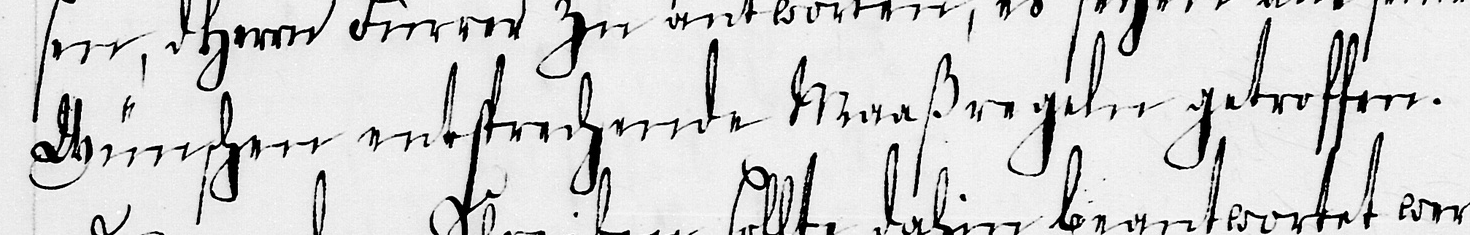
Wünschen entsprechende Maaßregeln getroffen.
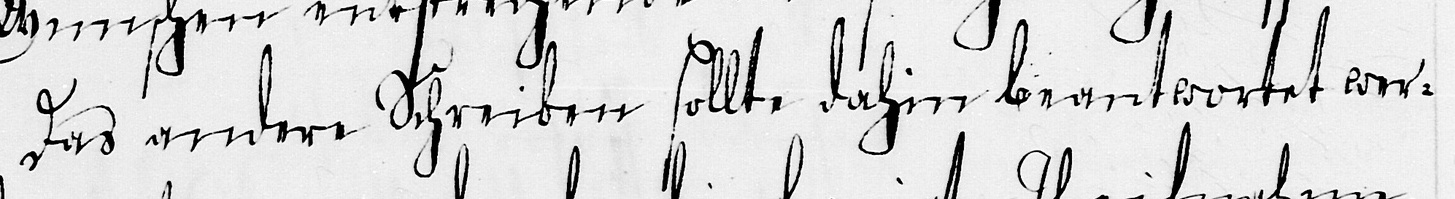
Das andere Schreiben sollte dahin beantwortet wer¬
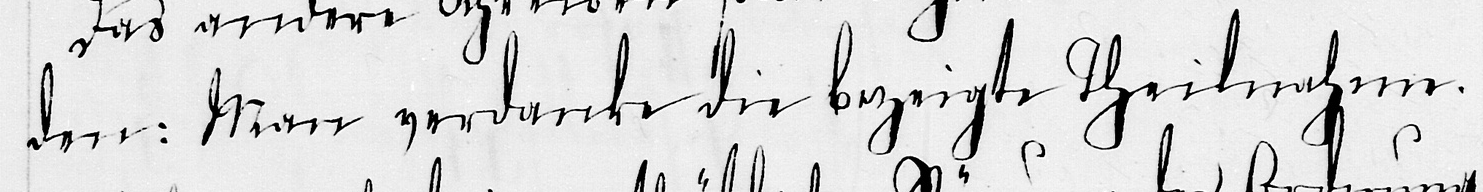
den: Man verdanke die bezeigte Theilnahme.
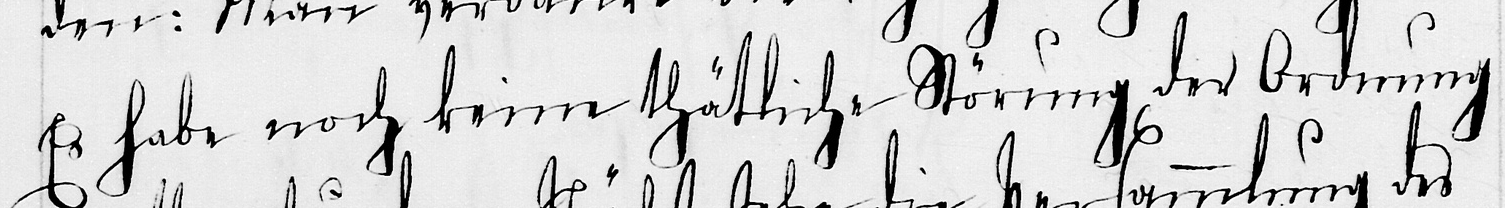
Es habe noch keine thätliche Störung der Ordnung
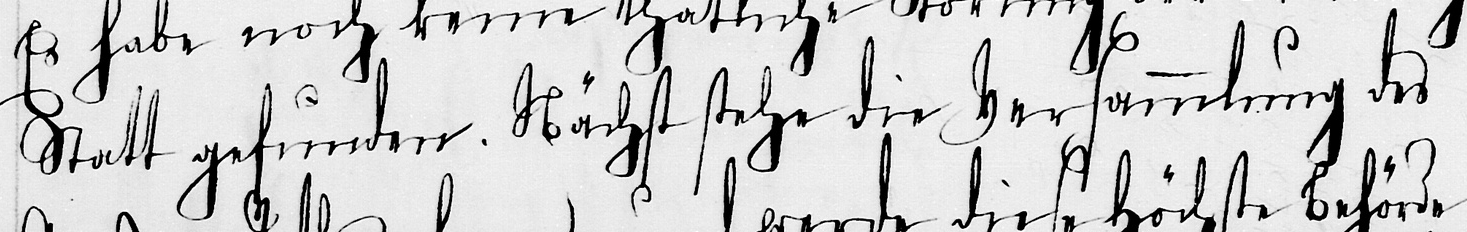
Statt gefunden. Nächst stehe die Versammlung des
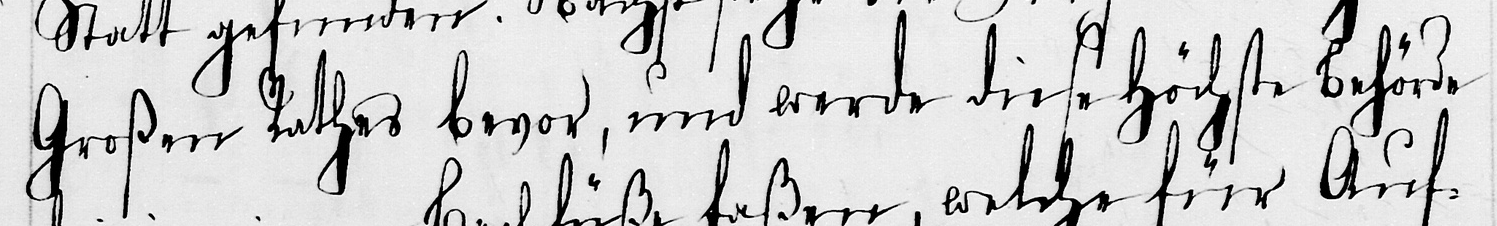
Großen Rathes bevor, und werde diese Höchste Behörde
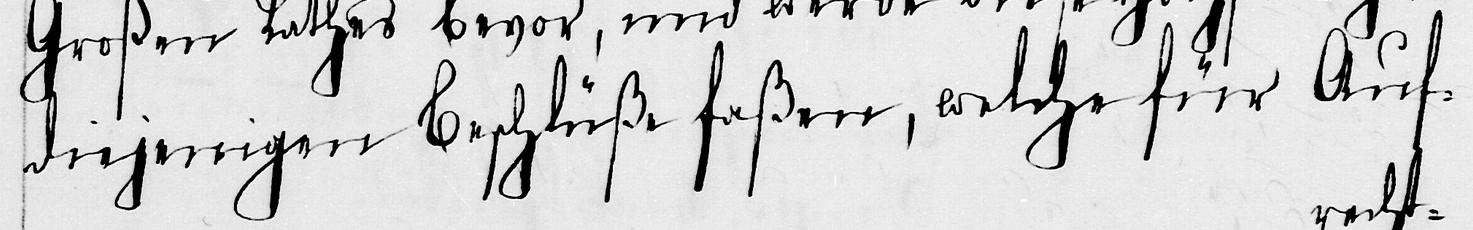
diejenigen Beschlüße faßen, welche für Auf-
